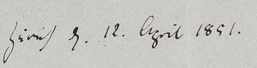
Zürich d. 12. April 1851.
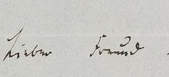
Lieber Freund!
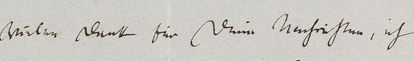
Vielen Dank für Deine Nachrichten, ich
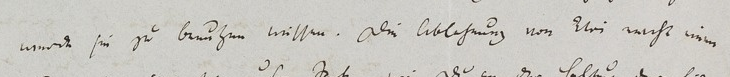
werde sie zu benutzen wissen. Die Ablehnung von Uri macht einen
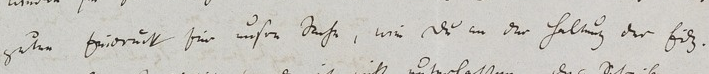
guten Eindruck für unsre Sache, wie Du an der Haltung der Eidg.
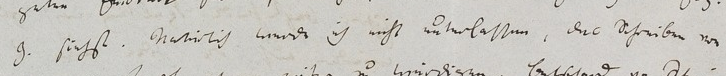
Z. siehst. Natürlich werde ich nicht unterlassen, das Schreiben von
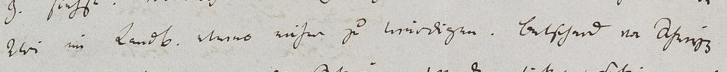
Uri im Landb. etwas näher zu würdigen. Betschard von Schwyz
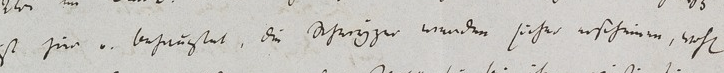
ist hier &. behauptet, die Schwyzer werden sicher erscheinen, wohl
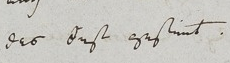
das Fest gestimmt.
